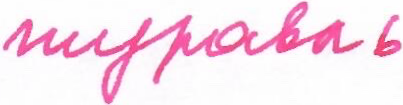журавль
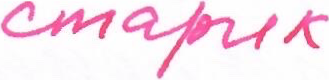старик
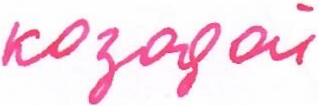козодой
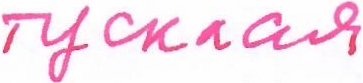тусклая
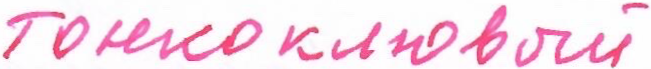тонкоклювый
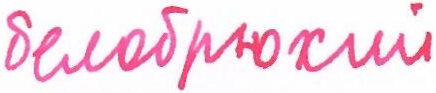белобрюхий
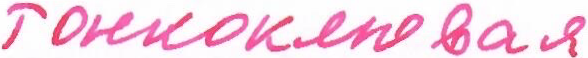тонкоклювая
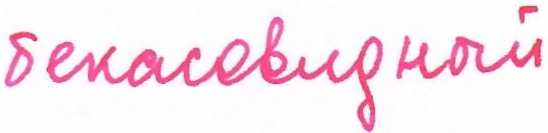бекасовидный
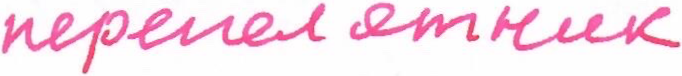перепелятник
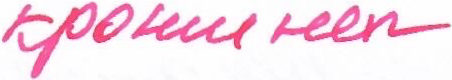кронш неп
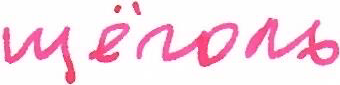щёголь
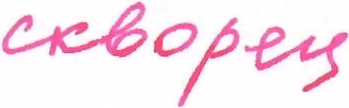скворец
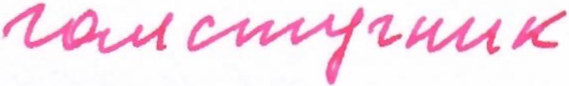галстучник
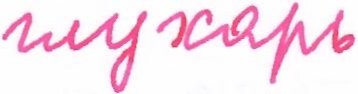глухарь
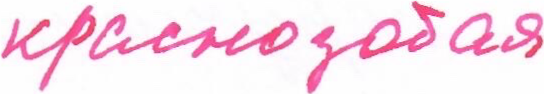краснозобая
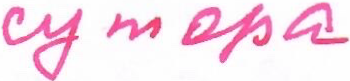сутора
